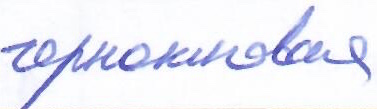черноклювая
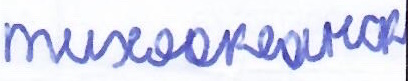тихоокеанск
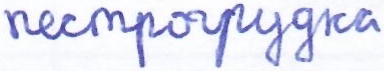пестрогрудка
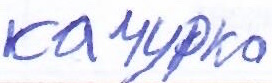качурка
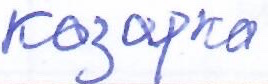козарка
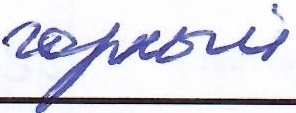горный
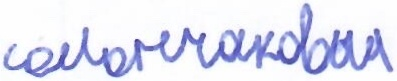солончаковыи
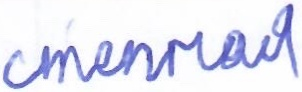степная
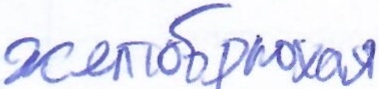желтобрюхая
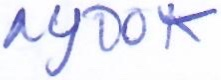луток
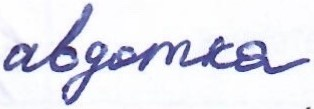авдотка
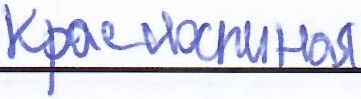красноспиная
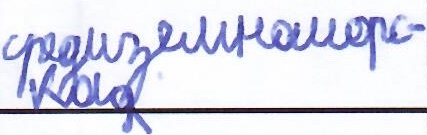средиземноморс-кая
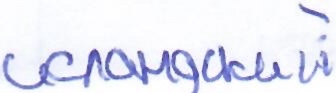исландский
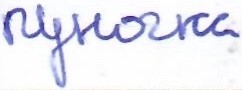пуночка
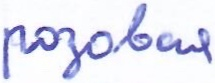розовая
